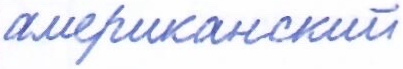американский
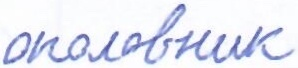ополовник
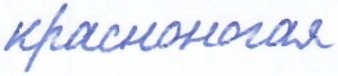красноногая
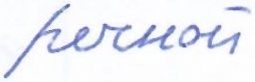речной
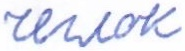чеглок
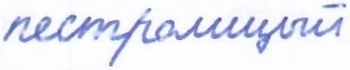пестролицый
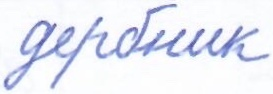дербник
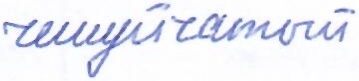чешуйчатый
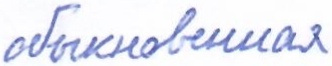обыкновенная
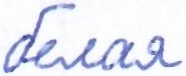белая
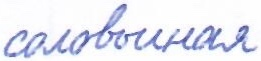соловьиная
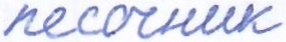песочник
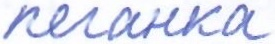пеганка
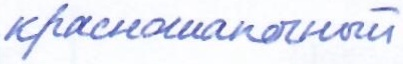красношапочный
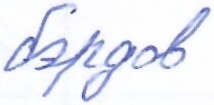бэрдов
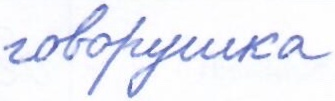говорушка
